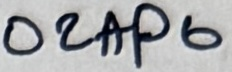огарь
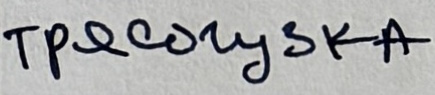трясогузка
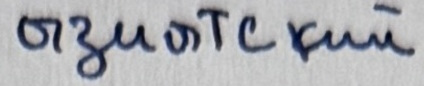азиатский
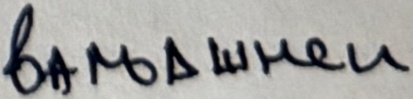вальдшнеп
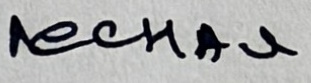лесная
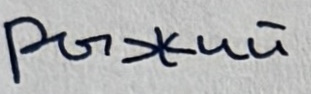рыжий
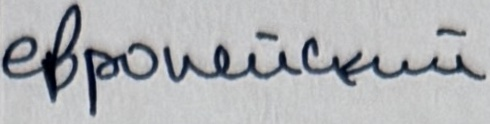европейский
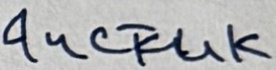чистик
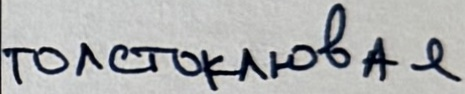толстоклювая
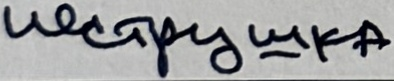пеструшка
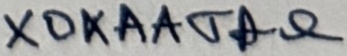хохаатая
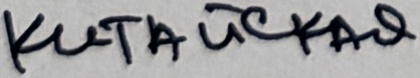китайская
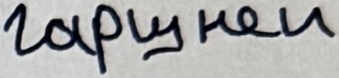гаршнеп
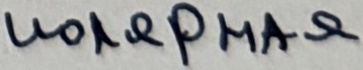полярная
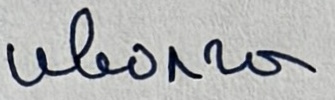иволга
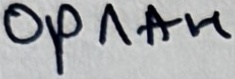орлан
